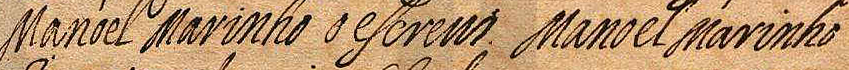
Manoel Marinho o escreui Manoel Marinho
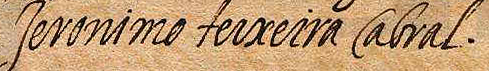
Jeronimo teixeira Cabral.
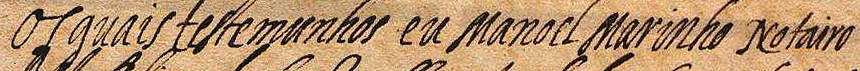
Os quais testemunhos eu Manoel Marinho Notairo
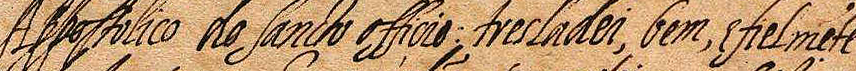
Appostolico do Sancto offiçio: tresladei, bem, E fielme̅te
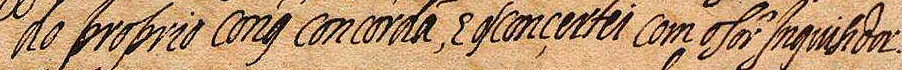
do proprio con q̅ concorda̅, E os conçertei com o so̅r Jnquisidor.
